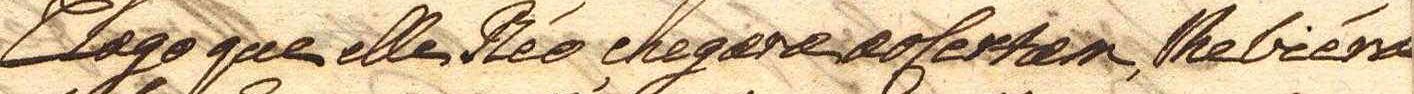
E Logo que elle Réo çhegara ao Certam, lhe viéra
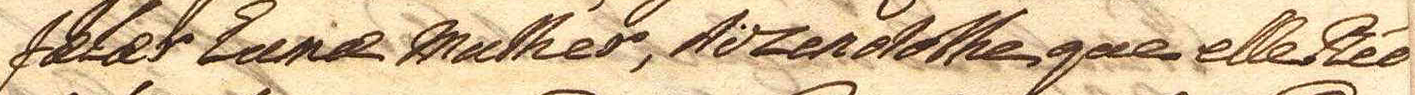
falar huma mulher, dizendolhe que elle Réo
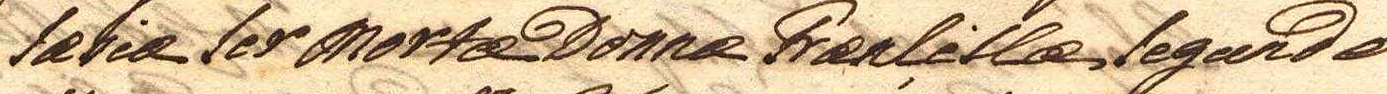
sabia ser morta Donna FranÇisCa segundo
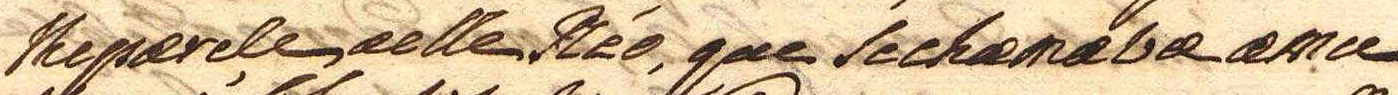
lhe pareÇe a elle Réo, que se chamava a mu
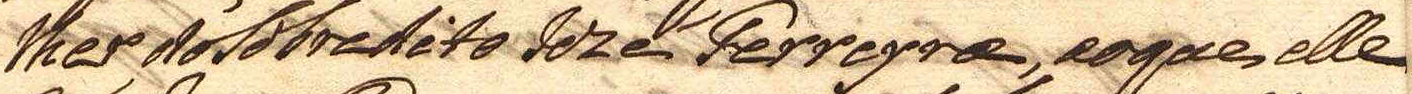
lher do sobredito Iozé Ferreyra, ao que elle
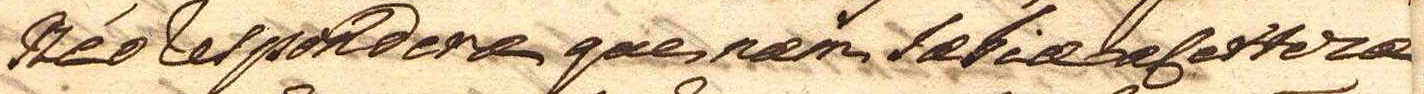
Réo Respondera que nam sabia a Certeza
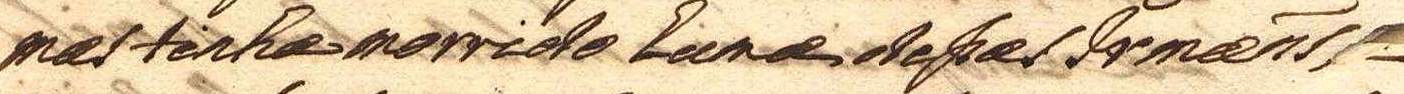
mas tinha morrido huma dessas Irman̄s,
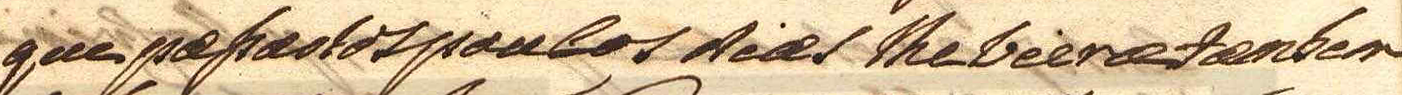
que passados pouCos dias lhe viera tambem
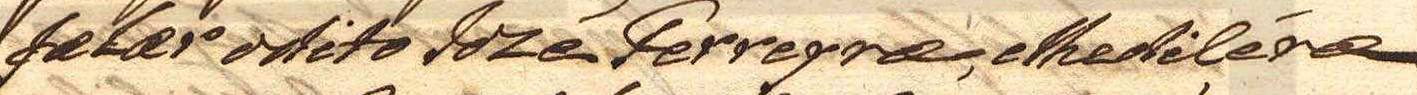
falar o dito Iozé Ferreyra, e lhe diÇéra
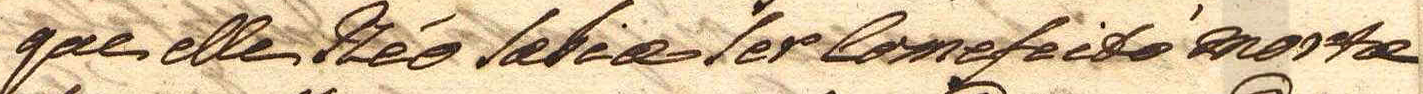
que elle Réo sabia ser Com efeito morta
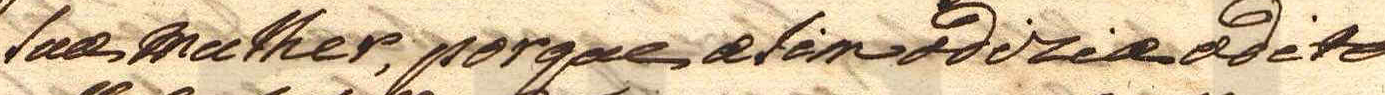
sua mulher, porque asim o dizia o dito
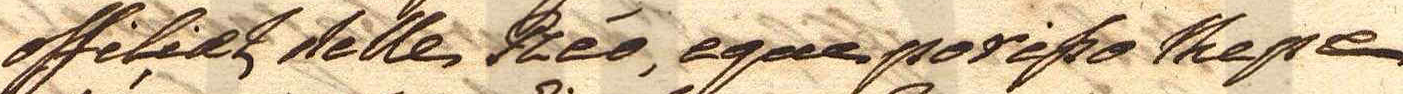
offiÇial delle Réo, e que por isso lhe pe
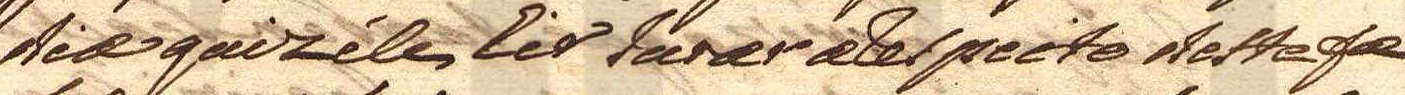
dia quizéÇe hir Iurar a Respeito deste fa
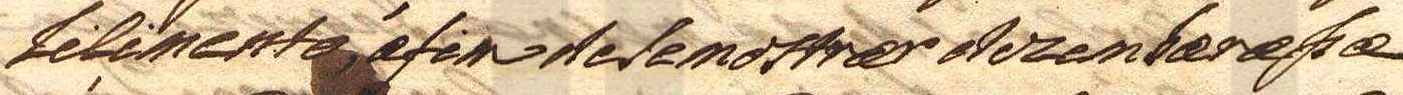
LiÇimento, a fim de se mostrar dezembarassa
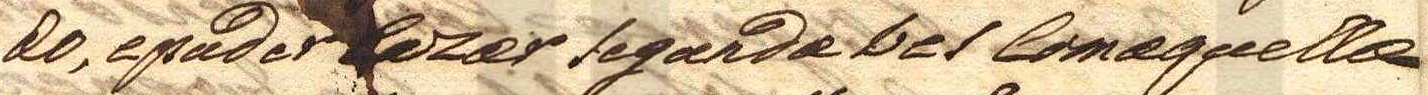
do, e puder Cazar segunda ves Com aquella
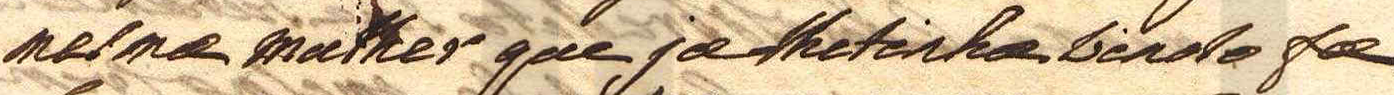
mesma mulher que ja lhe tinha vindo fa
